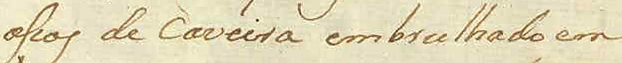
ossos de caveira embrulhado em
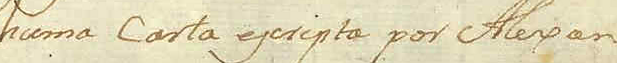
huma Carta escripta por Alexan
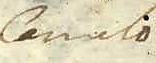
Camilo
